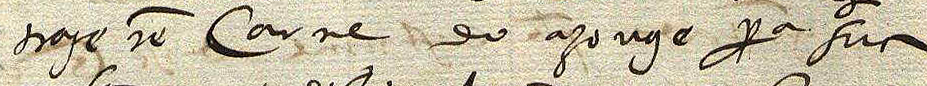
tragerē Carne do azouge ꝑa sua
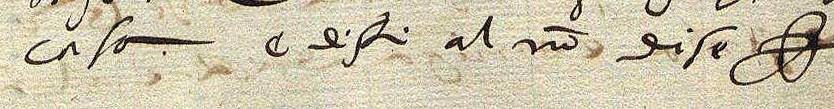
casa e deste al nō dise
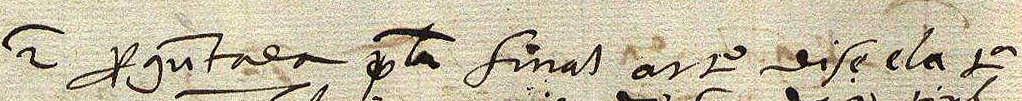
item ꝑgūtada p̄la final arto dise ela ta
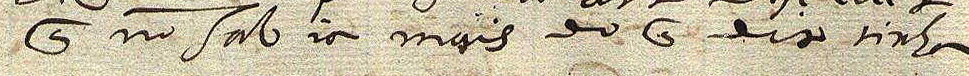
q̄ n̄o sabia mais do q̄ dito tinha
